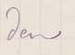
den
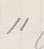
11
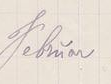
Februar
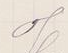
1879.
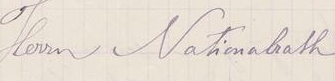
Herrn Nationalrath
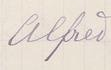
Alfred
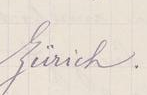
Zürich.
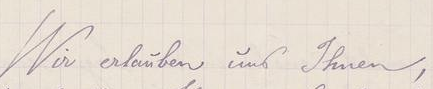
Wir erlauben uns Ihnen,
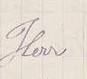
Herr
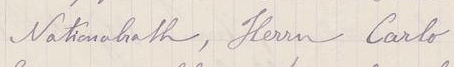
Nationalrath, Herrn Carlo
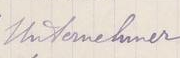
Unternehmer
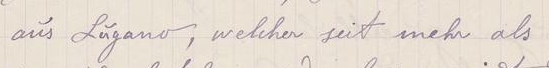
aus Lugano, welcher seit mehr als
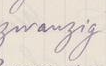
zwanzig
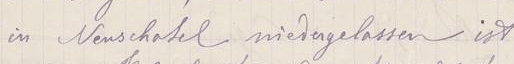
in Neuschatel niedergelassen ist,
